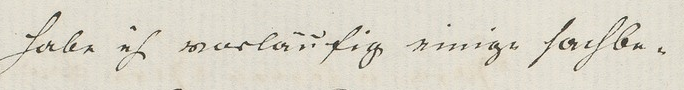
habe ich vorläufig einige sachbe-
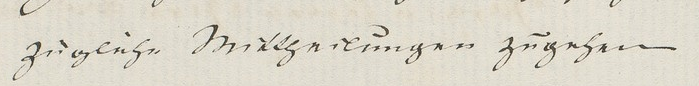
zügliche Mittheilungen zugehen
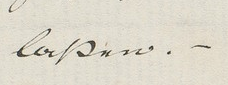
laßen. –
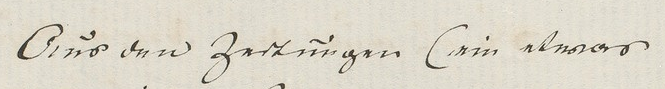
Aus den Zeitungen (ein etwas
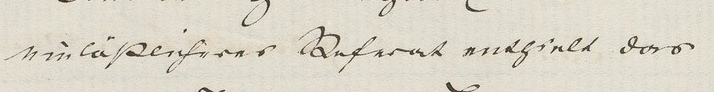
einläßlicheres Referat enthielt das
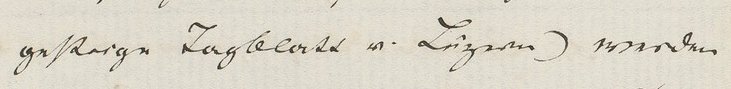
gestrige Tagblatt v. Luzern) werden
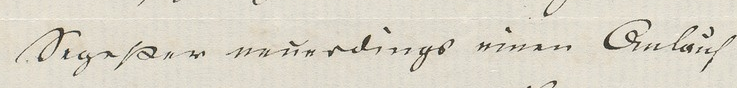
Segeßer neuerdings einen Anlauf
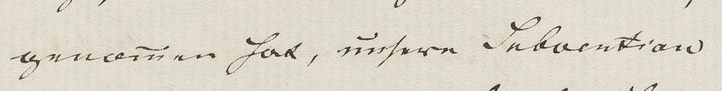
genommen hat, unsere Subvention
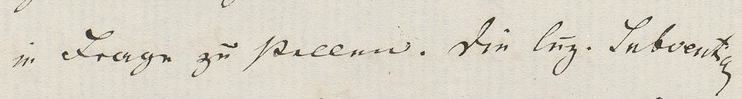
in Frage zu stellen. Die luz. Subvention
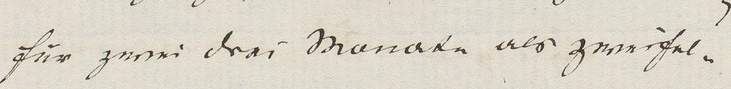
für zwei drei Monate als zweifel-
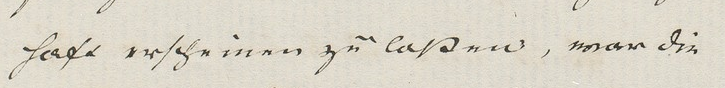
haft erscheinen zu laßen, war die
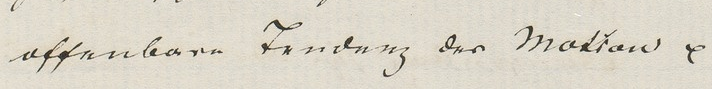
offenbare Tendenz der Motion &
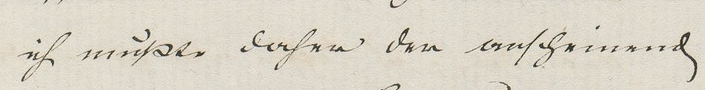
ich mußte daher der anscheinend
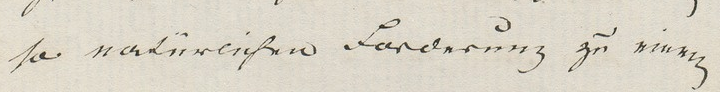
so natürlichen Forderung zu einem
